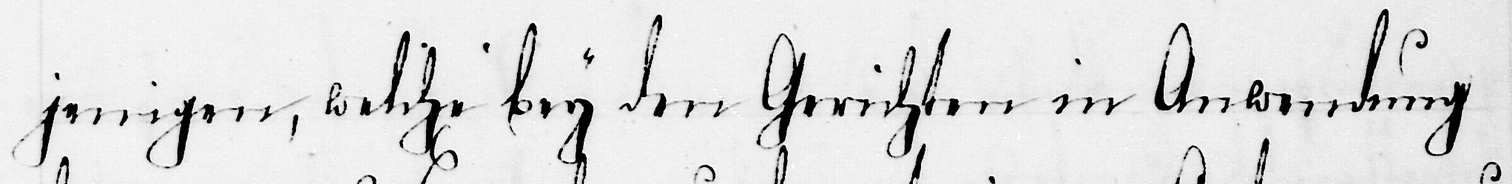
jenigen, welche bey den Gerichten in Anwendung
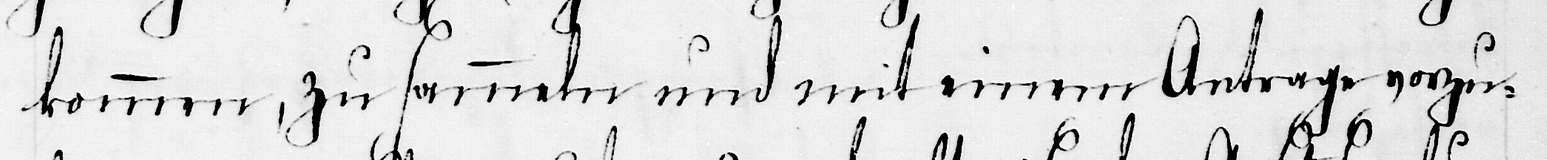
kommen, zu sammeln und mit einem Antrage vorzu¬
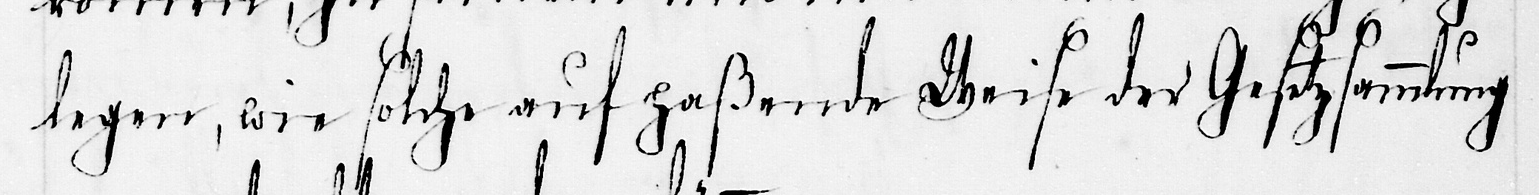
legen, wie solche auf paßende Weise der Gesetzsammlung
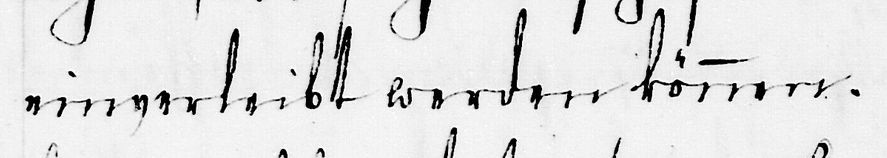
einverleibt werden können.
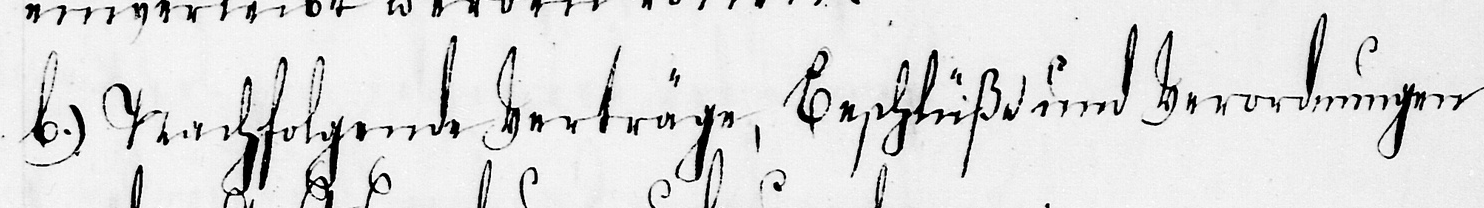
b.) Nachfolgende Verträge, Beschlüße und Verordnungen
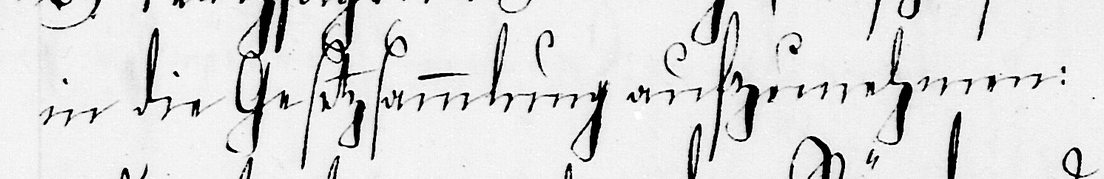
in die Gesetzsammlung aufzunehmen:
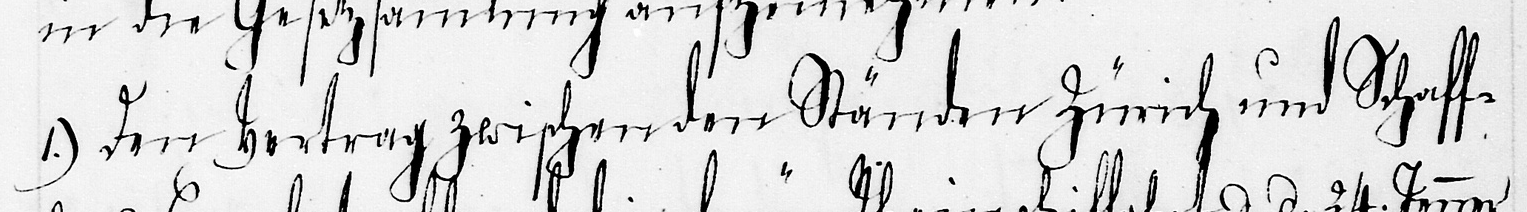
1.) Den Vertrag zwischen den Ständen Zürich und Schaff¬
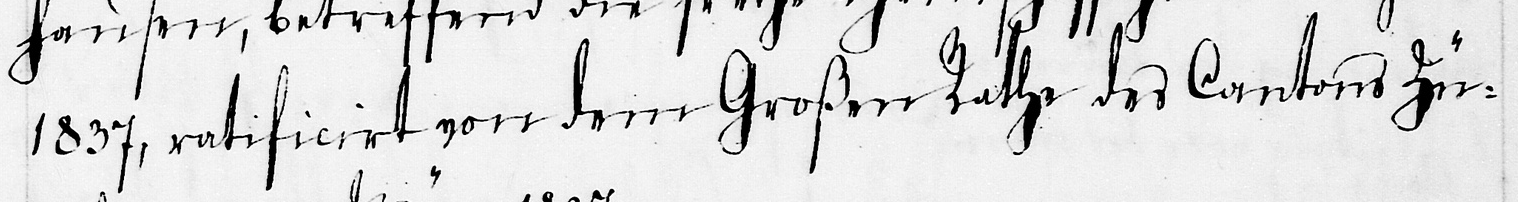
1837, ratificirt von dem Großen Rathe des Cantons Zü¬
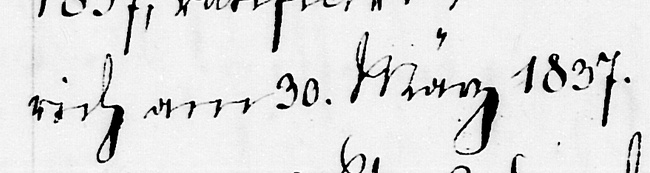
rich am 30. März 1837.
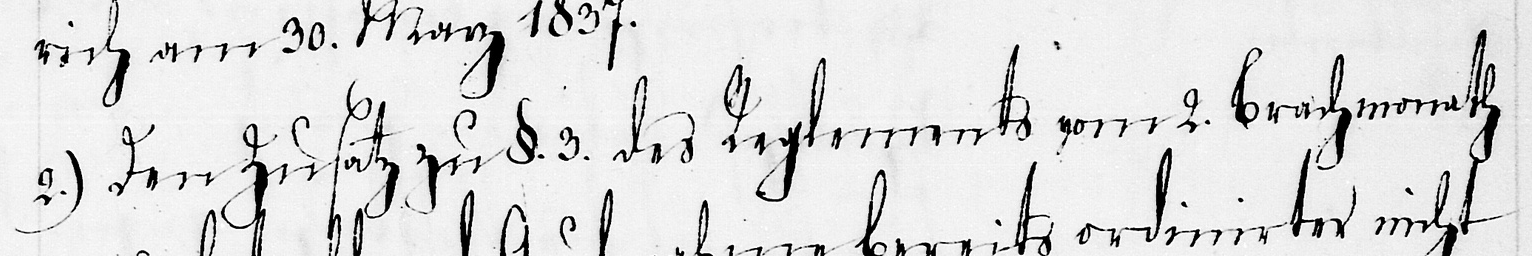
2.) Den Zusatz zu §. 3. des Reglements vom 2. Brachmonath
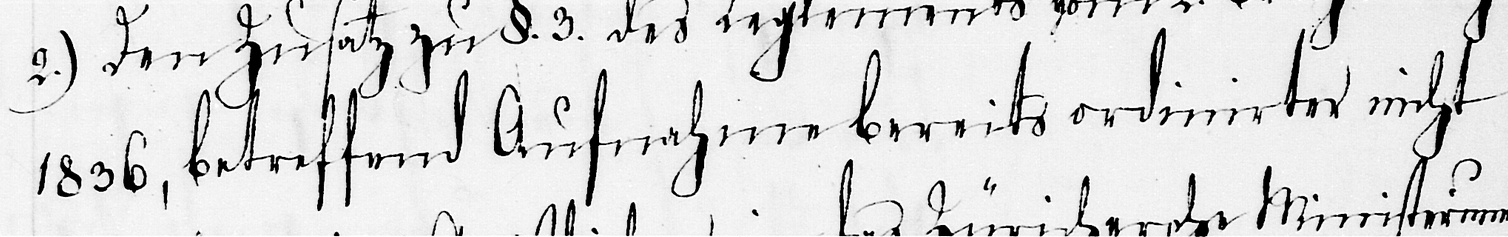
1836, betreffend Aufnahme bereits ordinirter nicht
